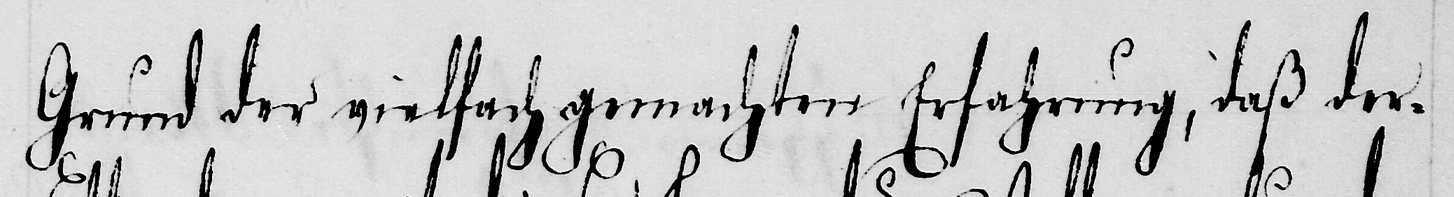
Grund der vielfach gemachten Erfahrung, daß der¬
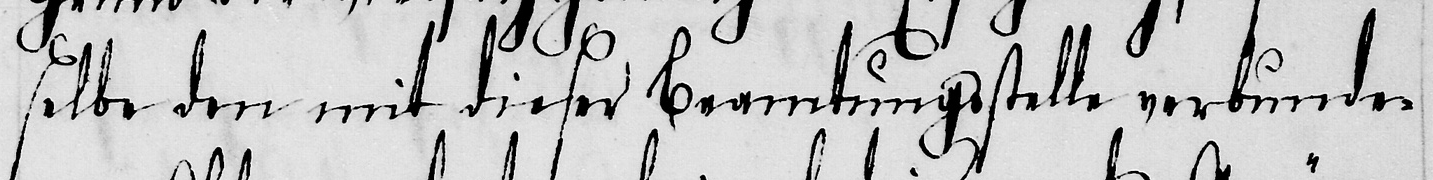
selbe den mit dieser Beamtungsstelle verbunde¬
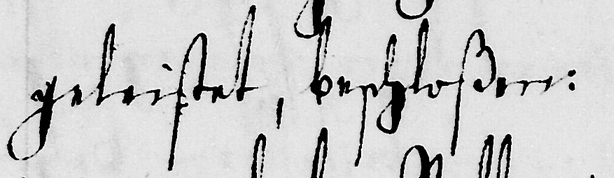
geleistet, beschloßen:
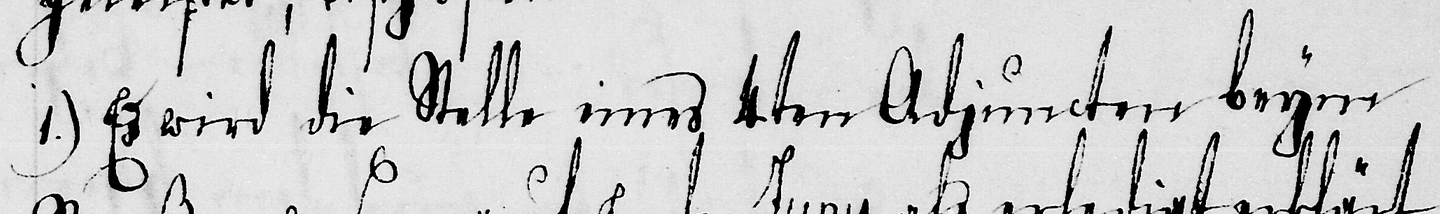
1.) Es wird die Stelle eines 4ten Adjuncten beym
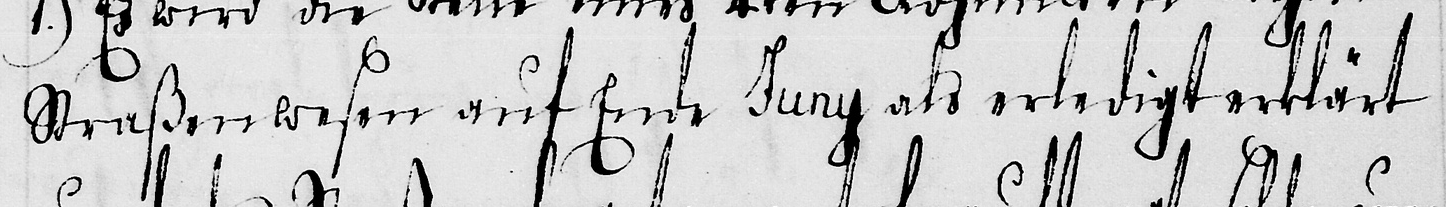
Straßenwesen auf Ende Juny als erledigt erklärt
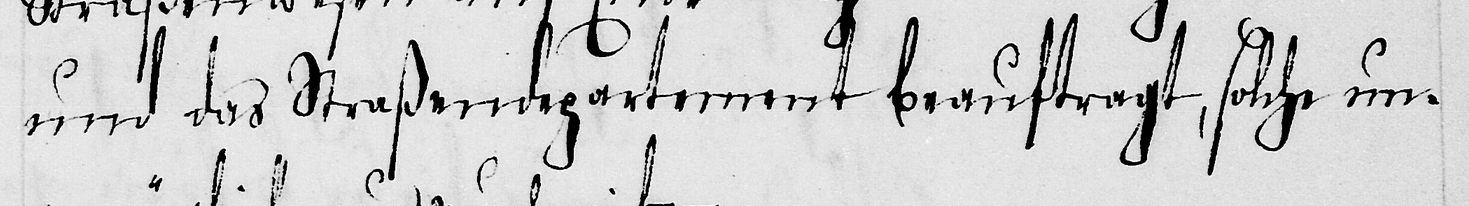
und das Straßendepartement beauftragt, solche un¬
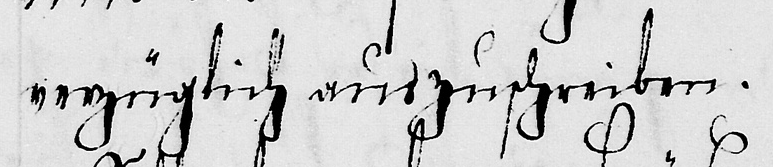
verzüglich auszuschreiben.
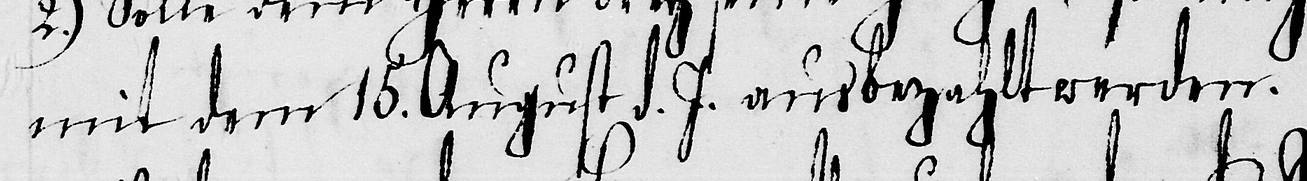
mit dem 15. August d. J. ausbezahlt werden.
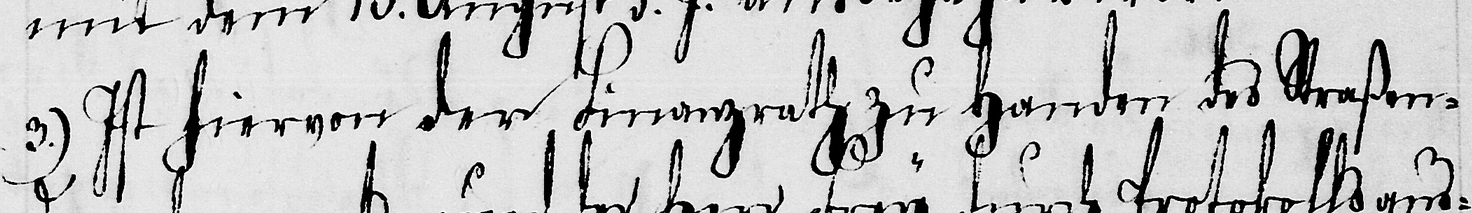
3.) Ist hiervon der Finanzrath zu Handen des Straße¬
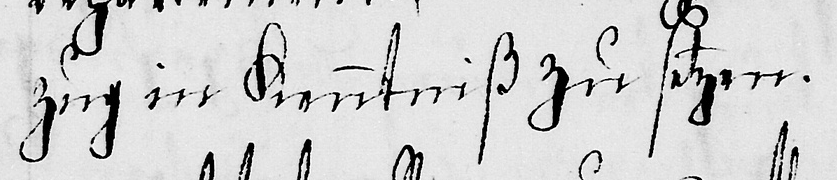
zug in Kenntniß zu setzen.
